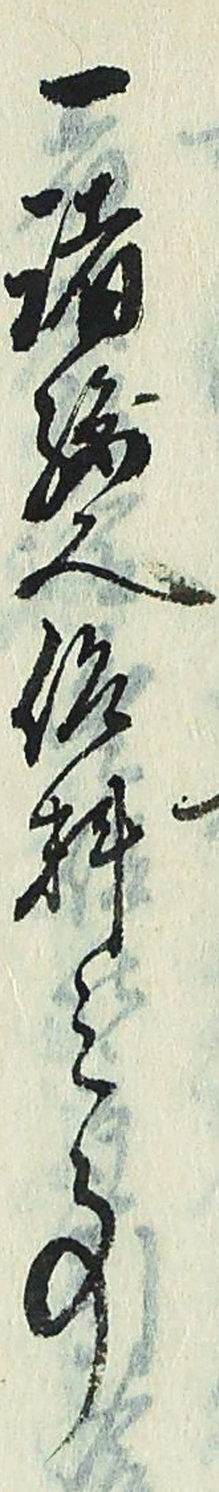一諸職人作料之事
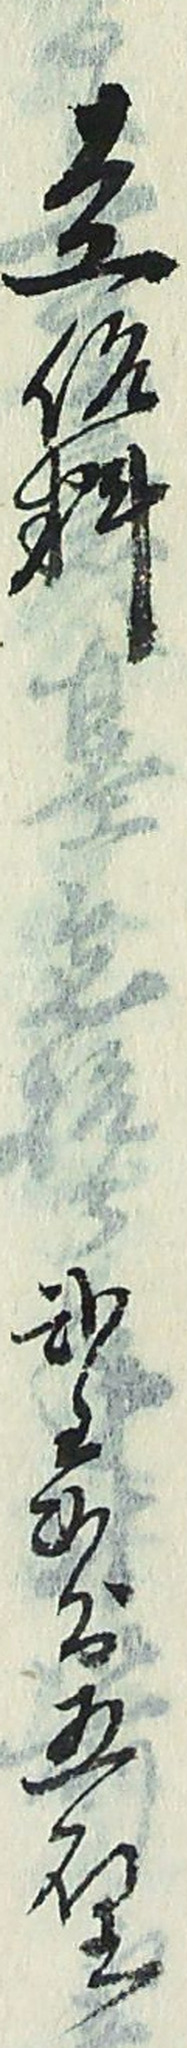大工作料弐匁弐分五厘
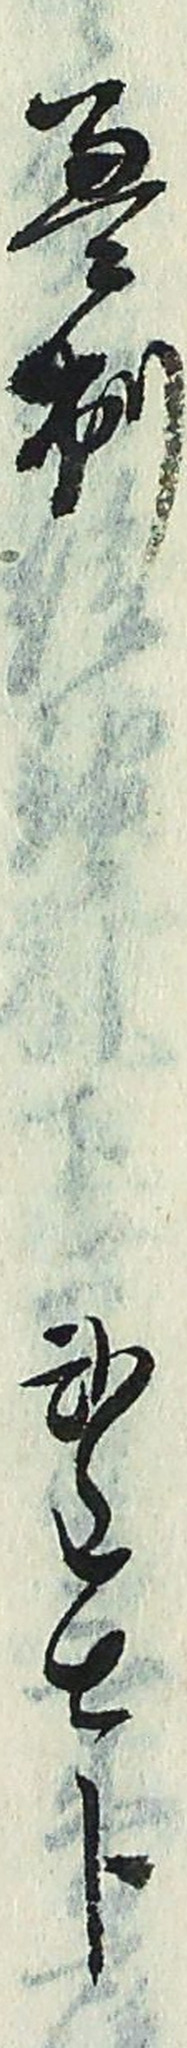畳刺弐匁七分
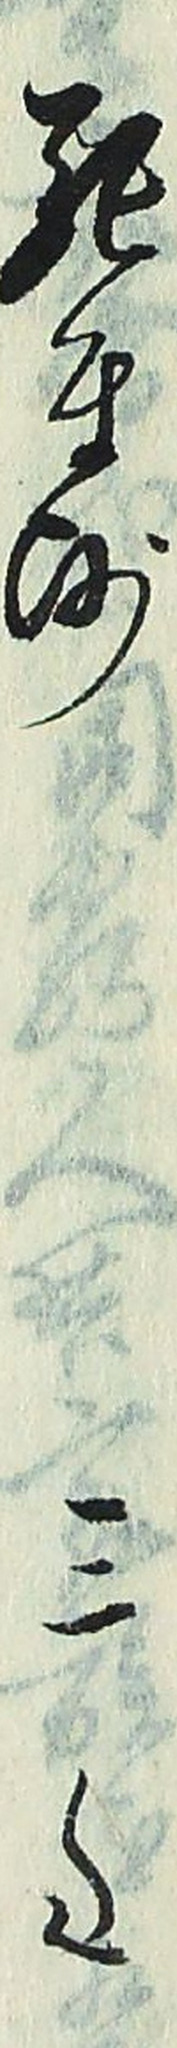張付師三匁
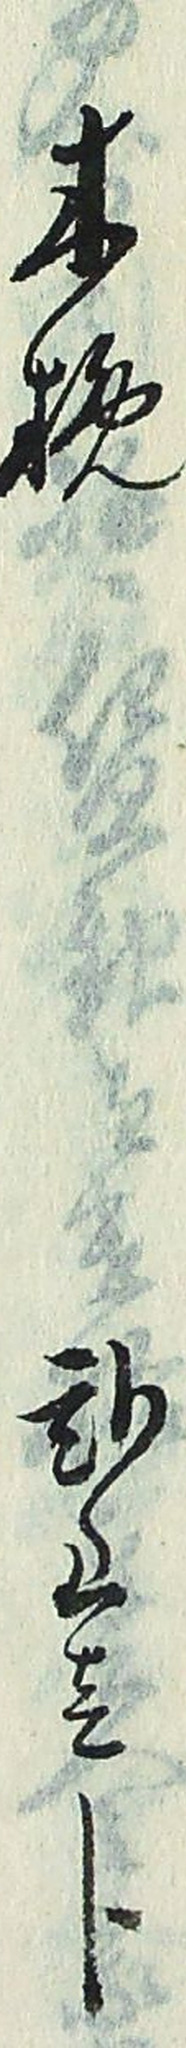木挽弐匁壱分
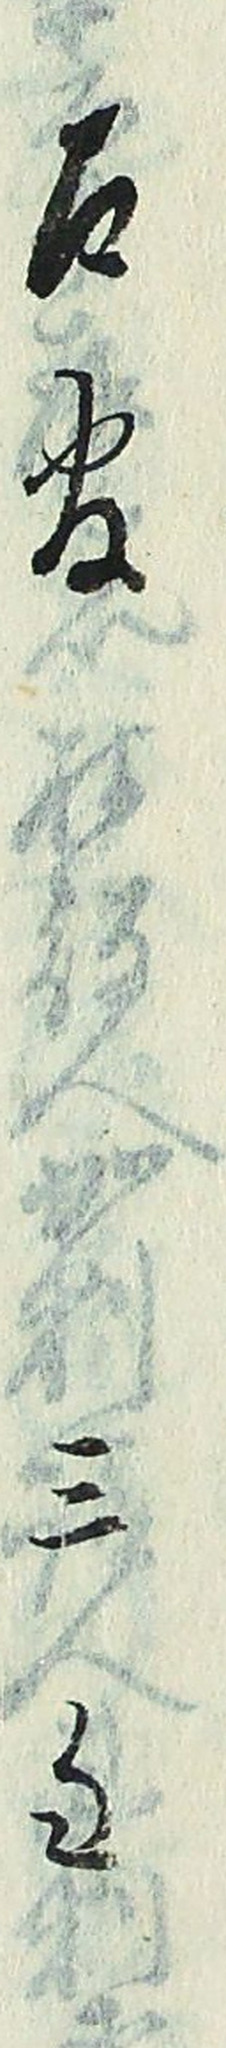左官三匁
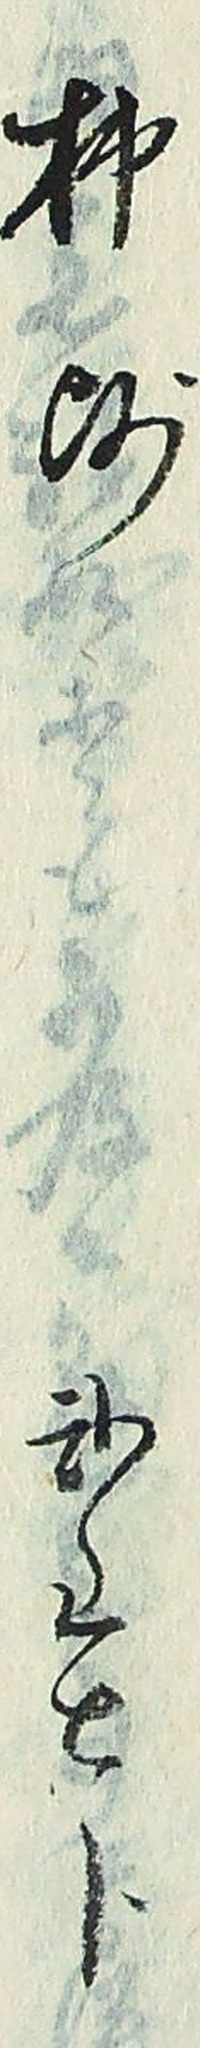杮師弐匁七分
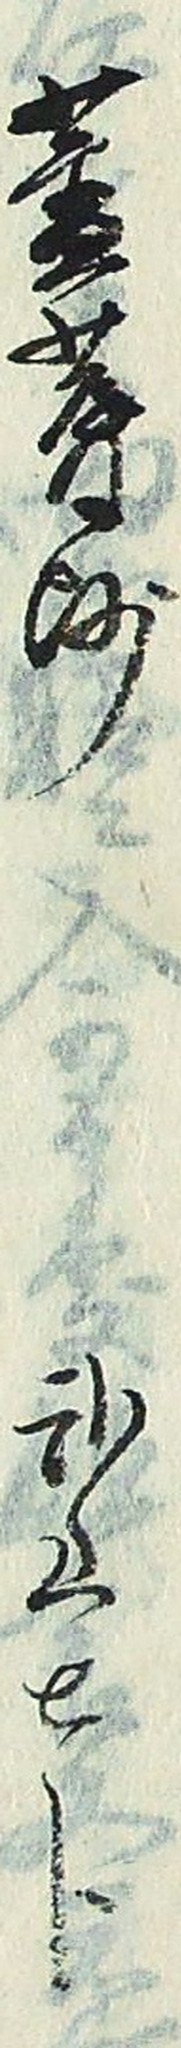萱葺師弐匁七分
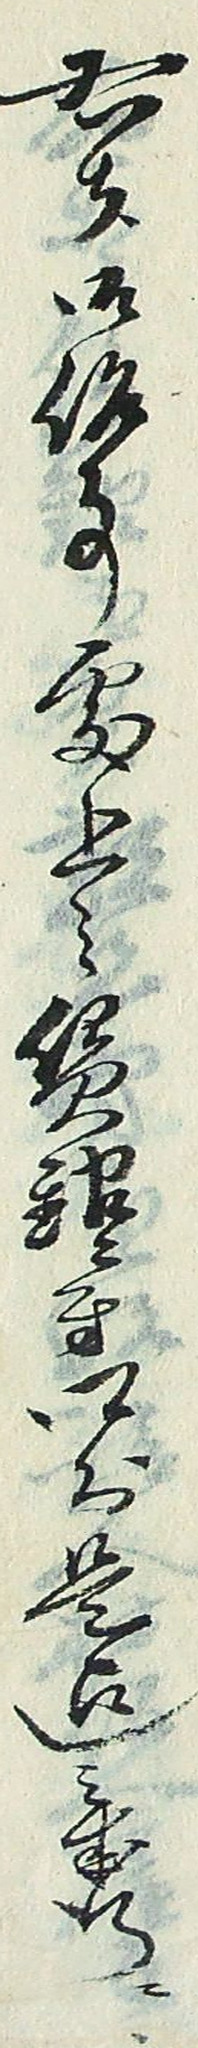右者御作事處上之賃銀ニ付郷分是迄之成行ニ

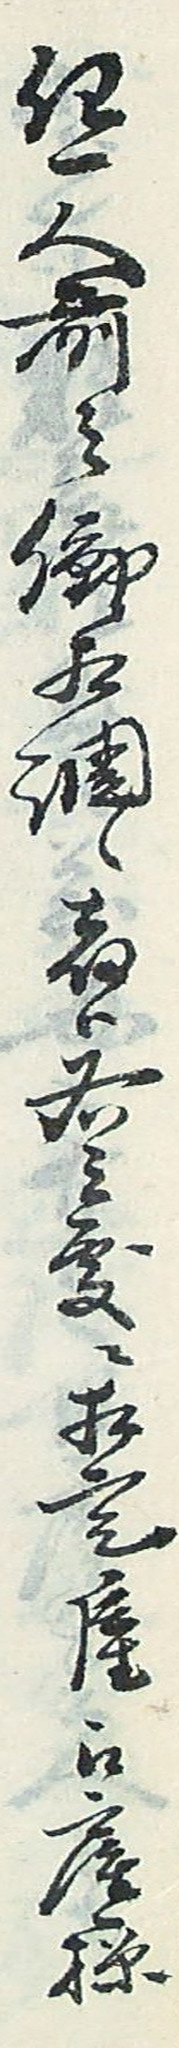任一人前之働相調候者ハ右之處ニ相定雇被雇候様
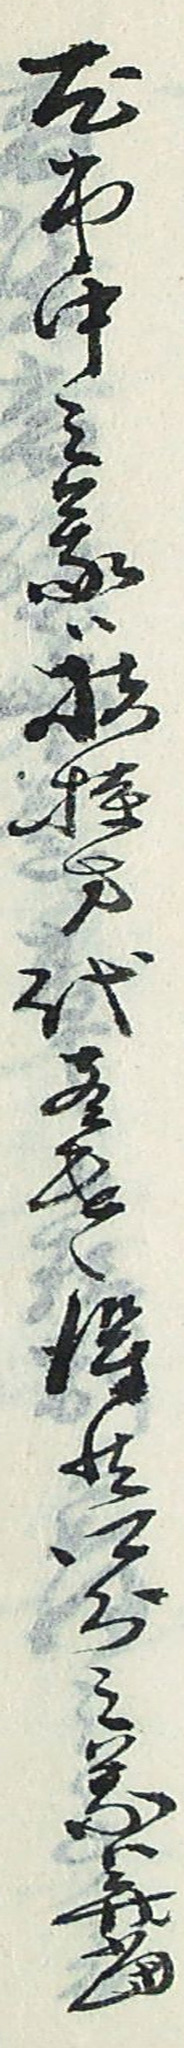尤市中之義ハ扶持方代差遣候得共郷分之義ハ弁當
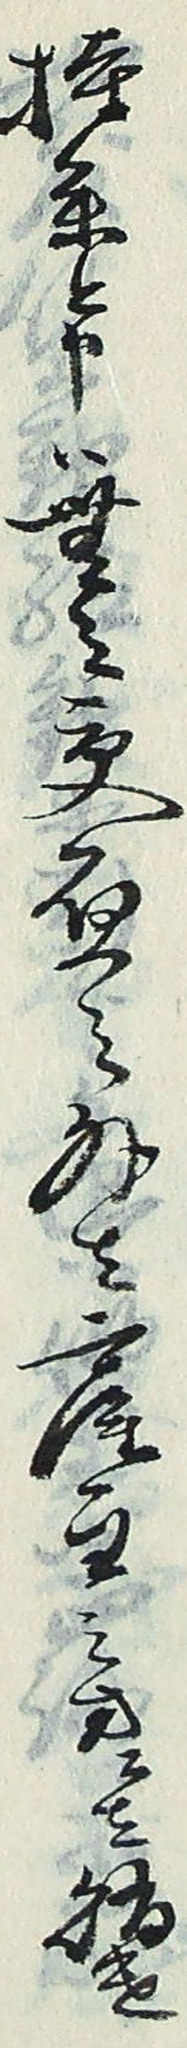持参と申ハ無之受負之外者雇主之方ニ者賄遣
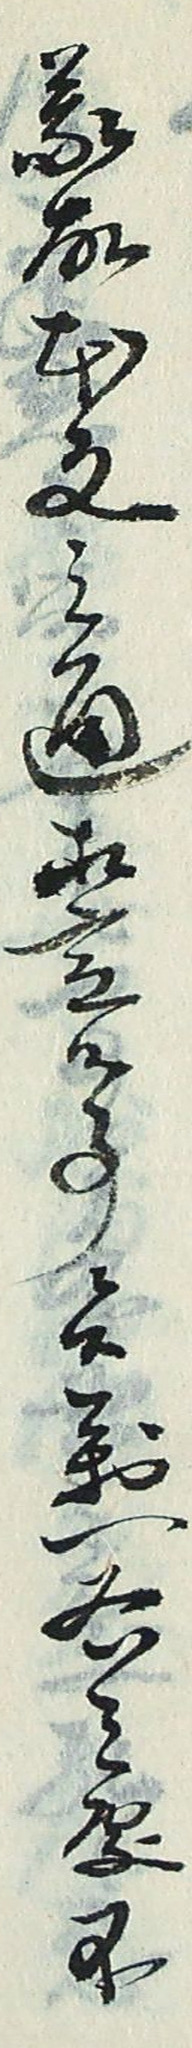義故本文之通相定候事ニ候萬一右之處不
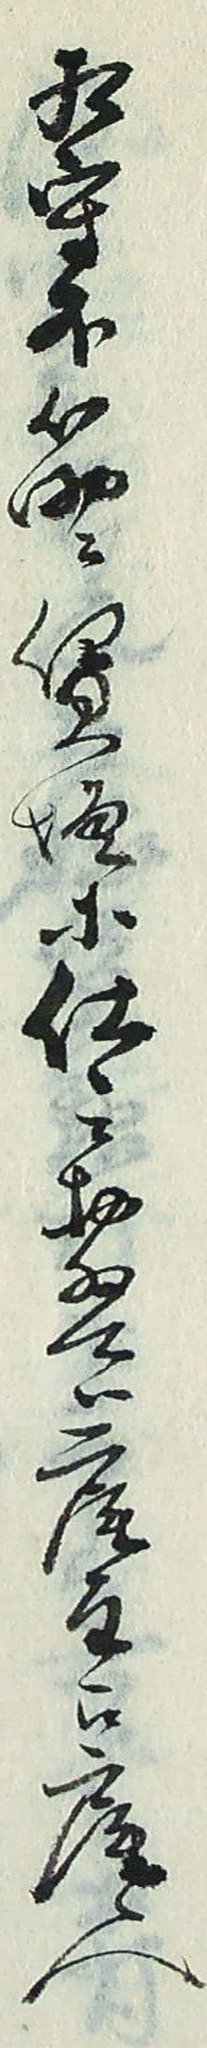相守不筋ニ賃増等仕候ニおゐてハ雇主被雇人
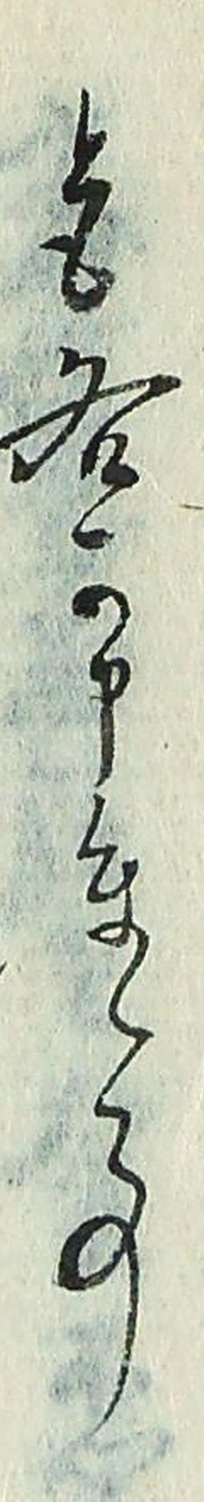とも右可申付候事
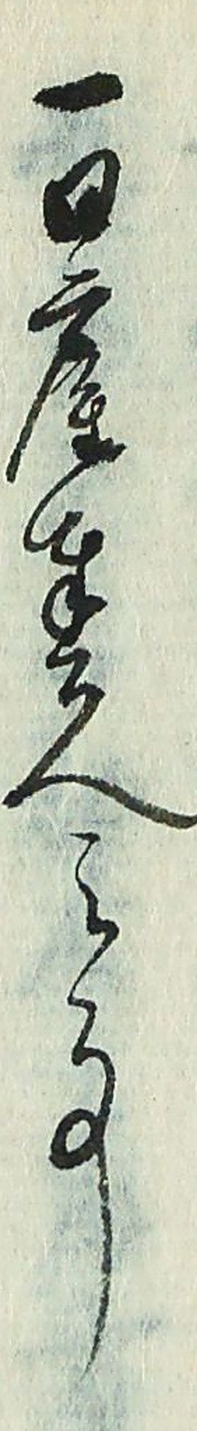一日雇奉公人之事
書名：諸御趣意書并御下知向之写
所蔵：鳴門教育大学 Naruto University of Education
